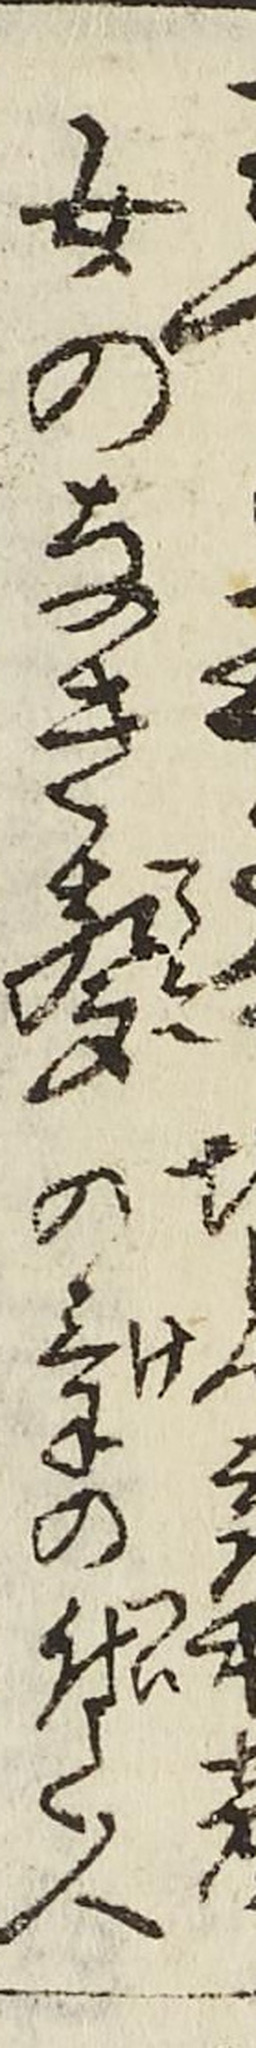女のなき声の気の付た人
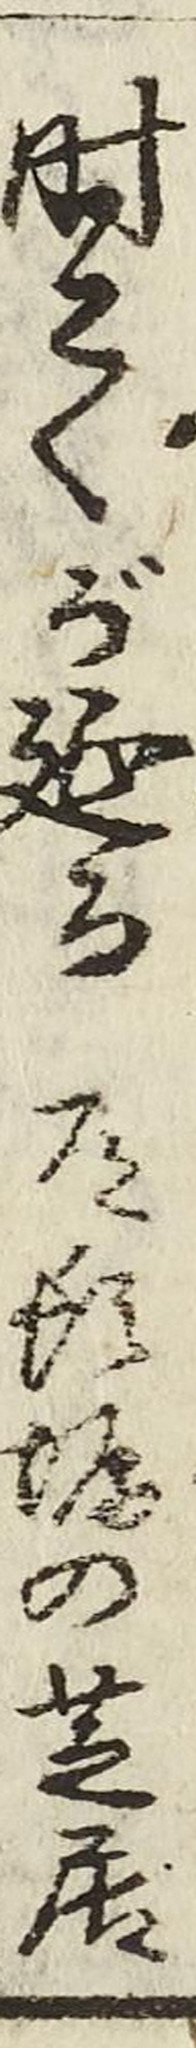時こくが延る道頓堀の芝居
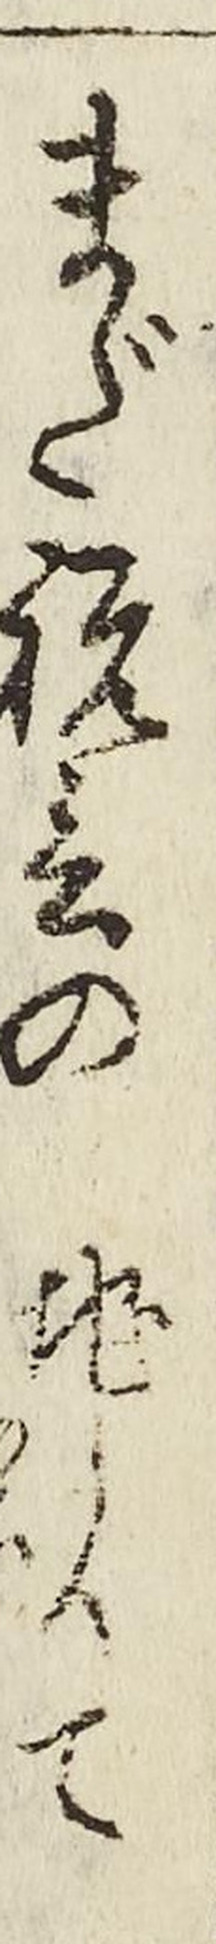まだ祝言の地しんて
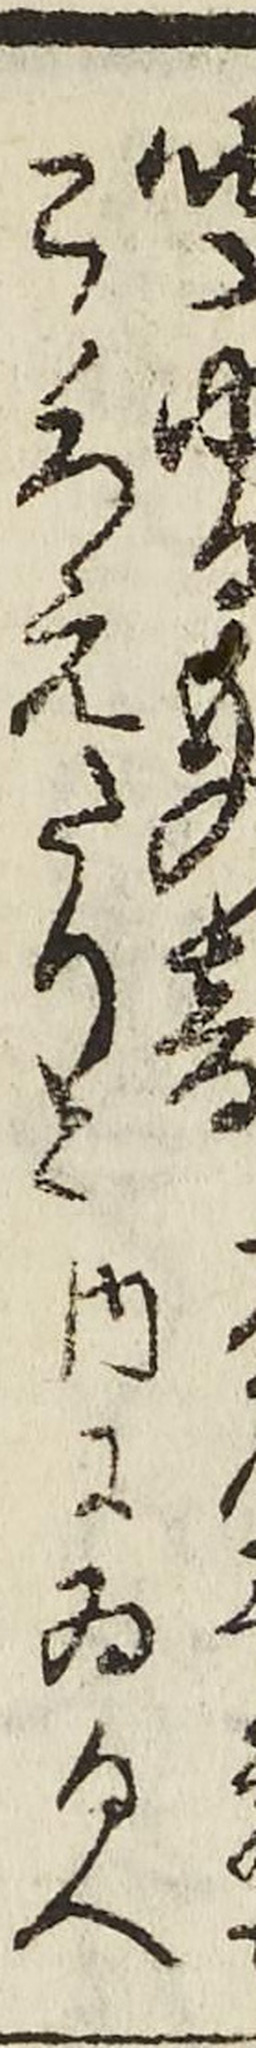こゝろえたりと内にゐる人
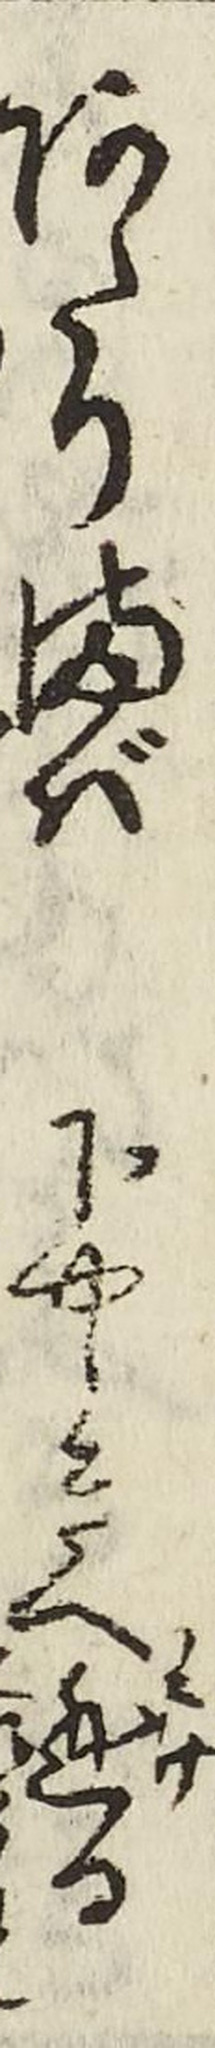あたりまば下やしきへ逃る
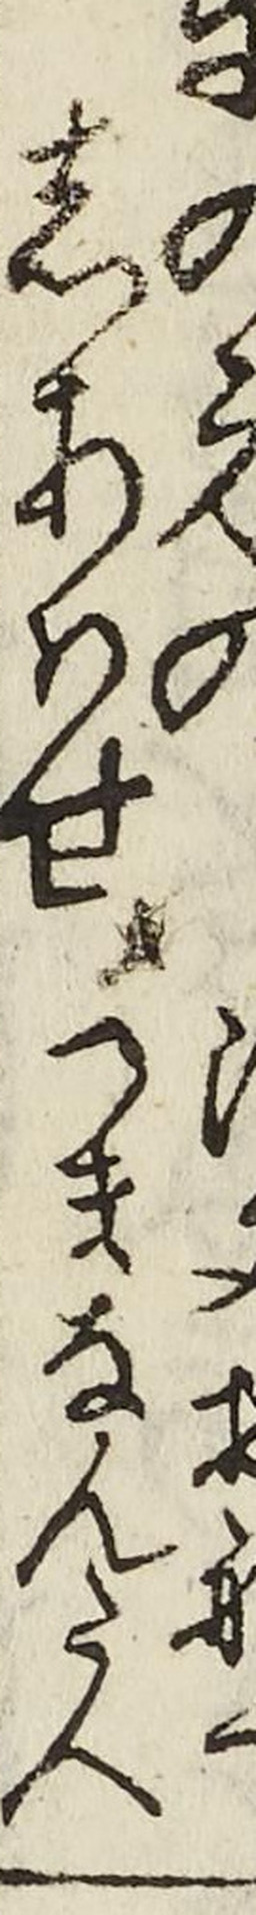しあはせつまなんた人
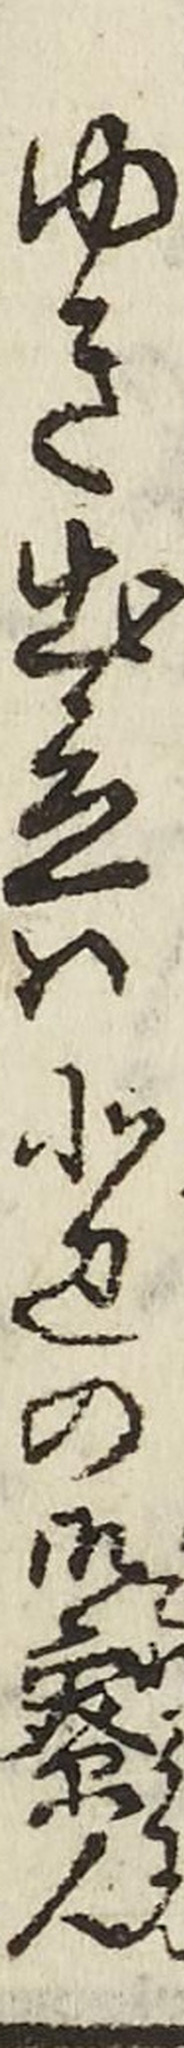ゆき出立は北廻の御寮人
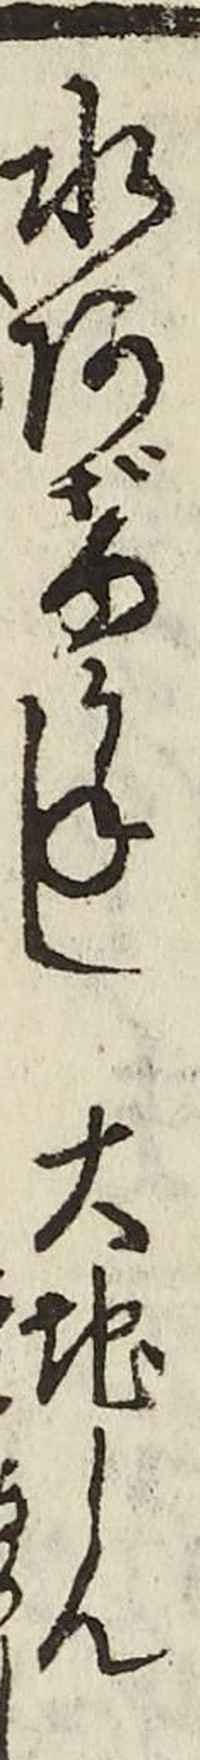水あげかねし大地しん
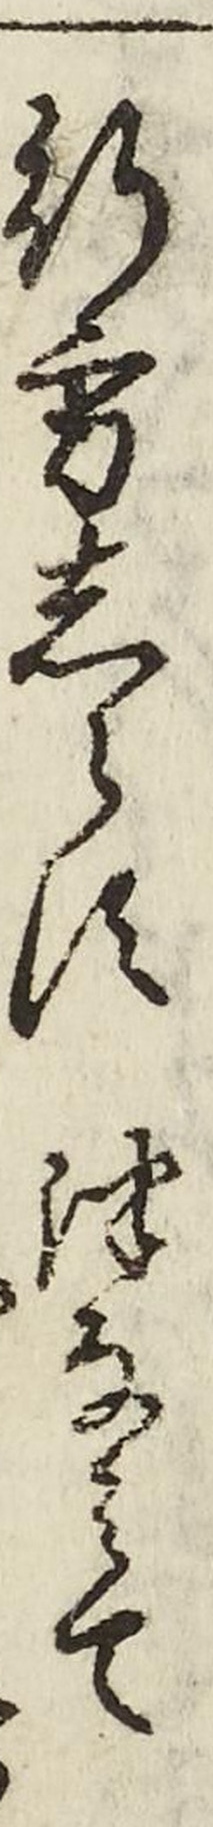行方しらす津なみて
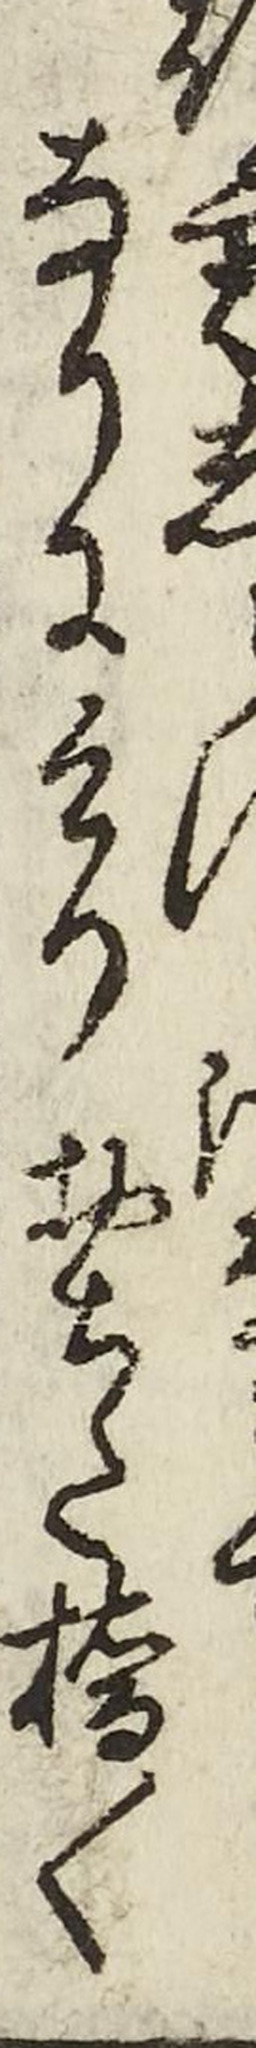なりにけりおちた橋々
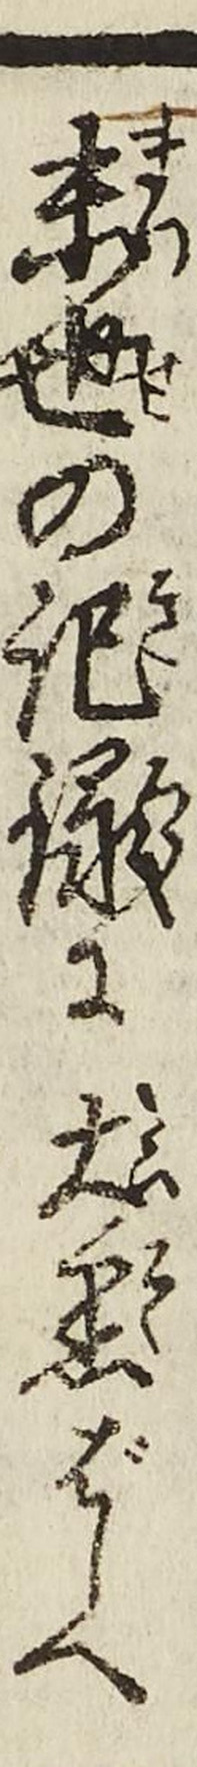末世の記録に大黒ばしへ
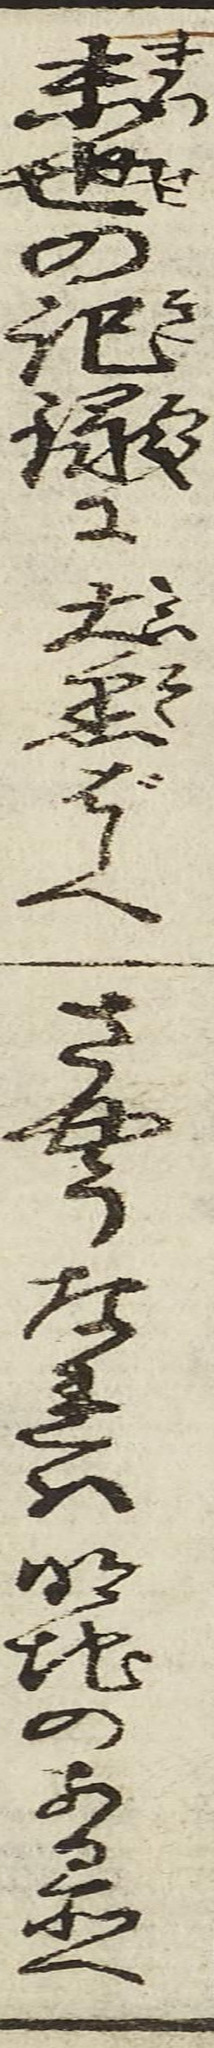末世の記録に大黒ばしへ
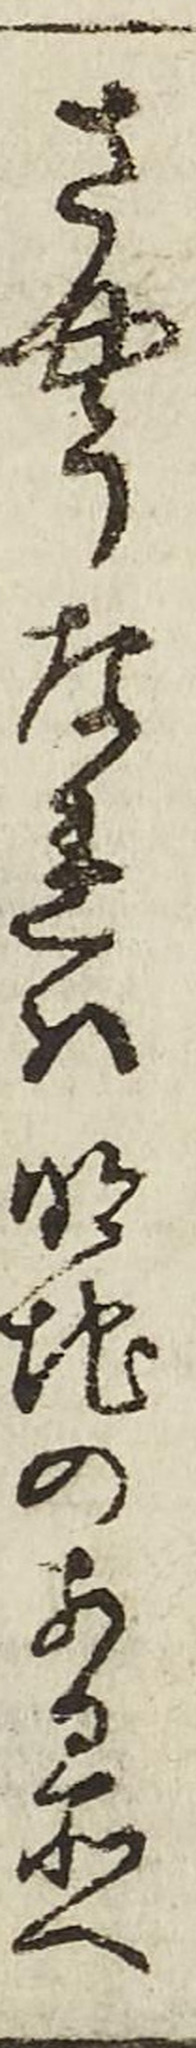さやうなれは明地のある所へ
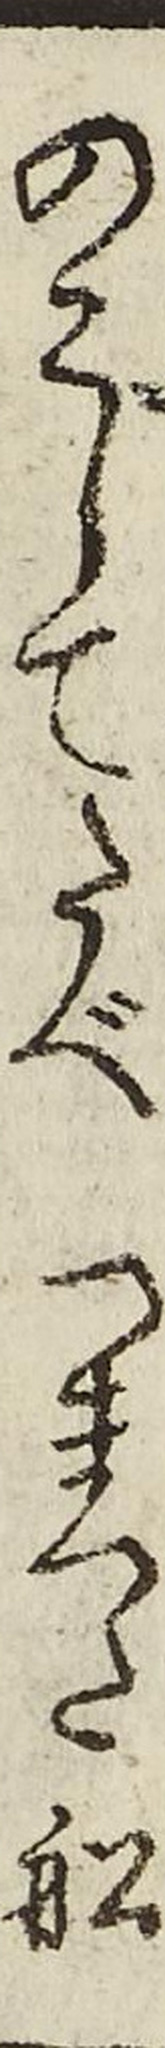のこしてたべつまつた船
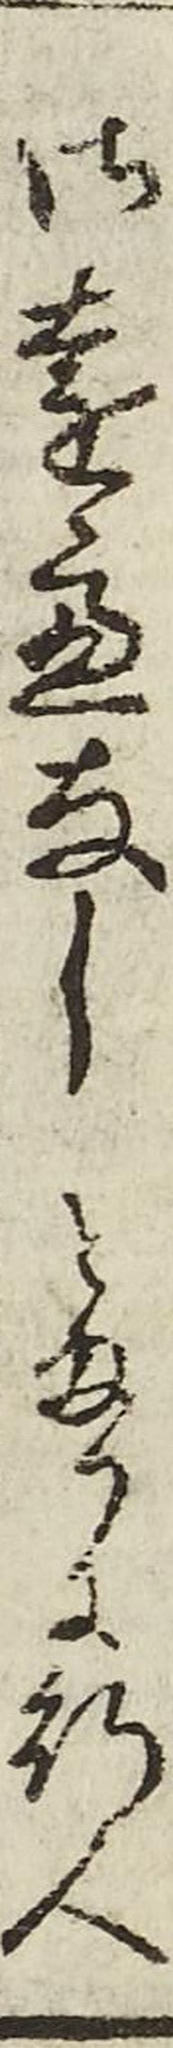御遠慮なしとまりに行人
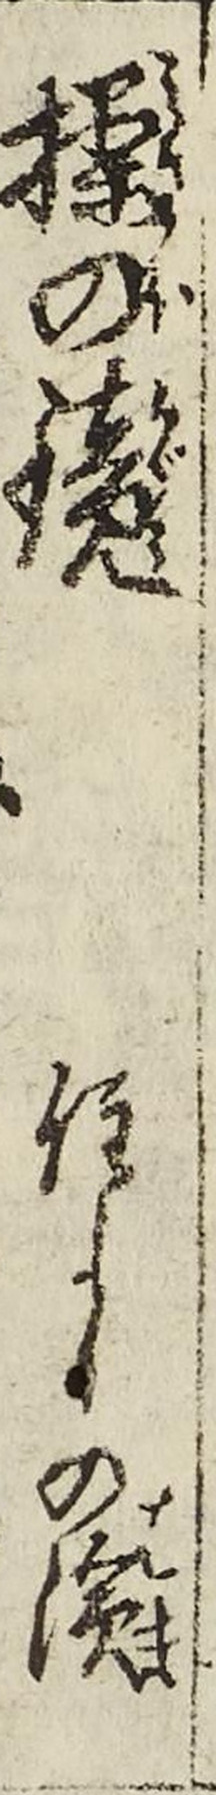操の鏡住よしの浜
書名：地震津浪末代噺の種　全
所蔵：東京大学地震研究所図書室 Earthquake Research Institute Library, The University of Tokyo, JAPAN
